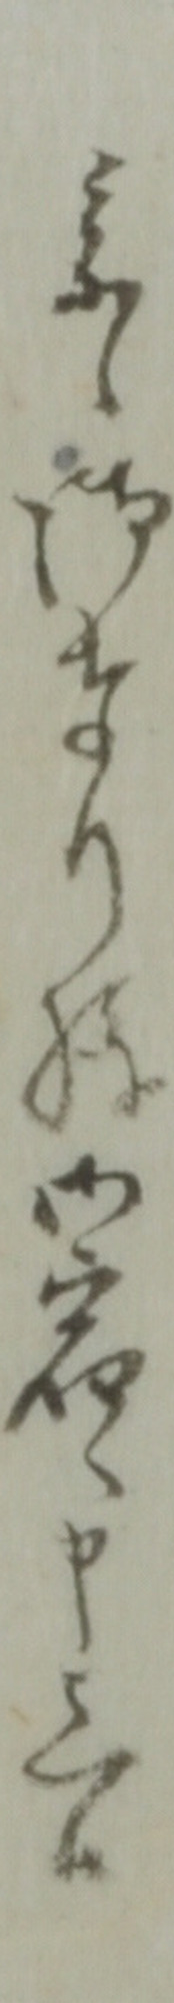参候御奉行様御宿ヘ申上候
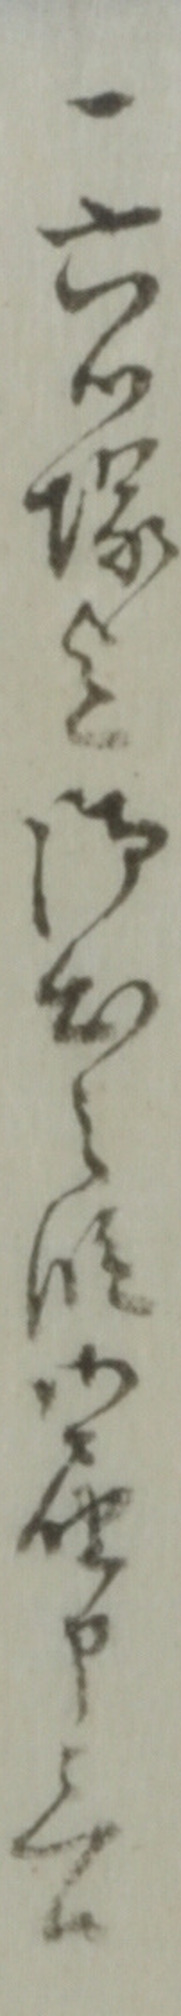一六ツ塚迄御出之段御届申上候
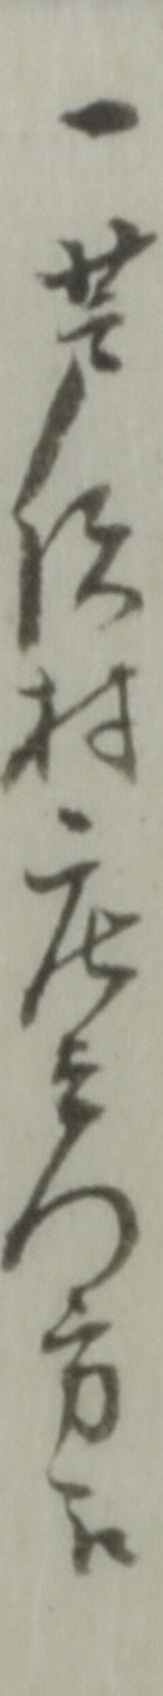一芦沢村庄兵衛方江
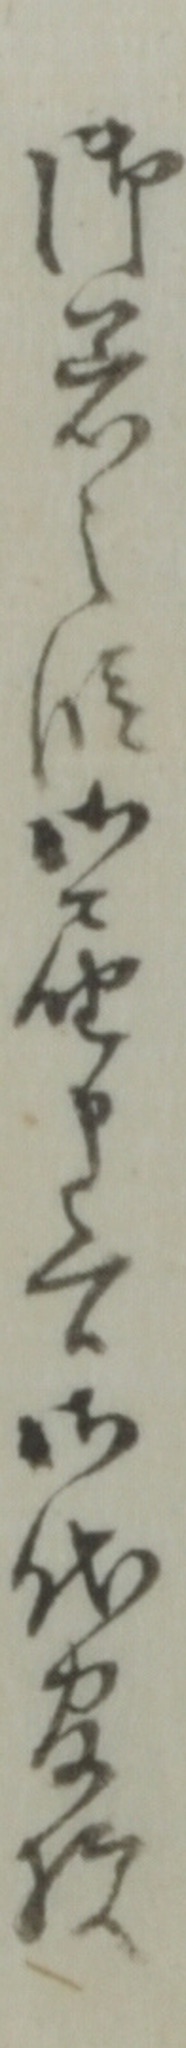御着之段御届申上候御代官様
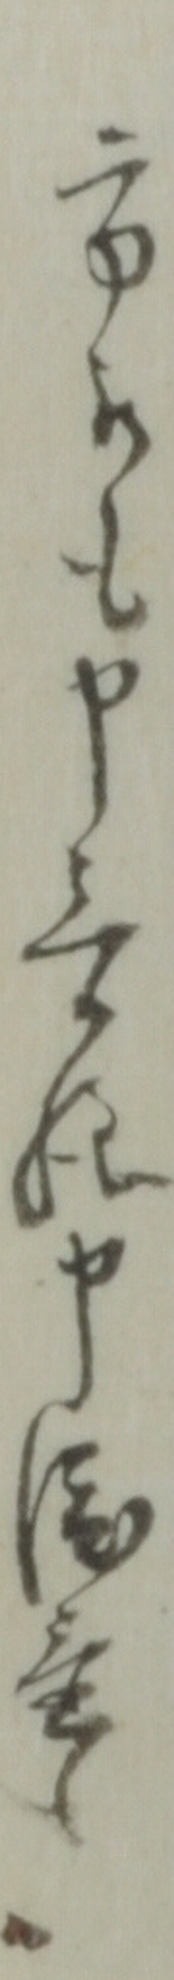方江も申上候様申渡置候
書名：御初入諸事控
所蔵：伊那市立高遠町図書館・合同会社AMANE
